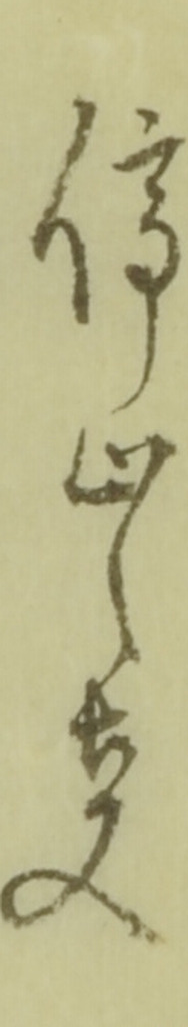停止の事
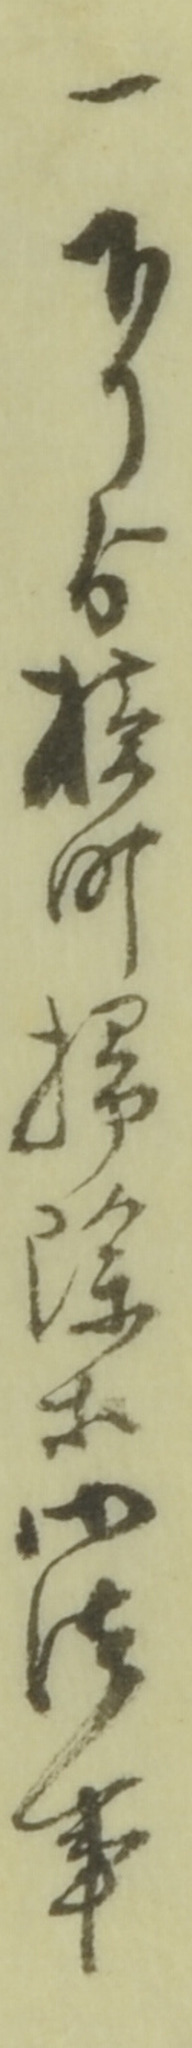一下りゟ横町掃除等御法事
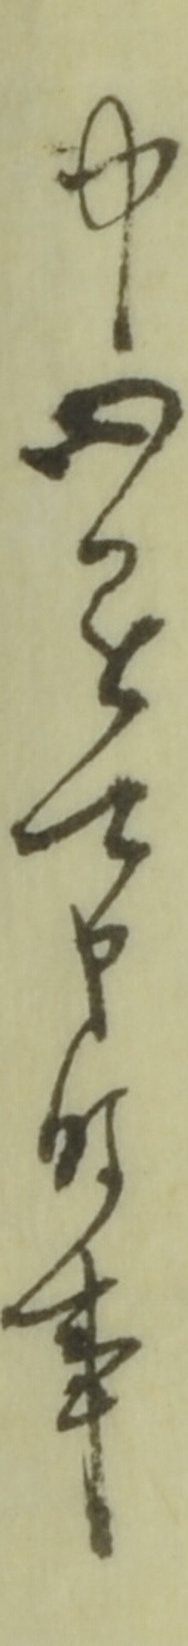中心懸可申付事

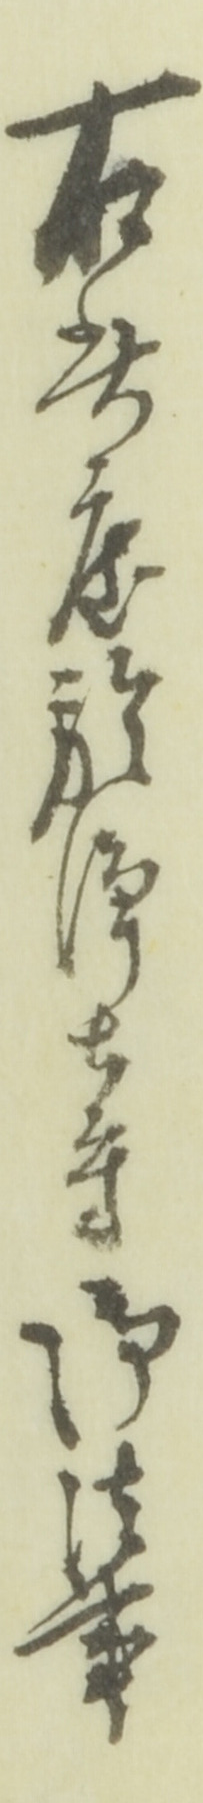右此度於浄土寺御法事
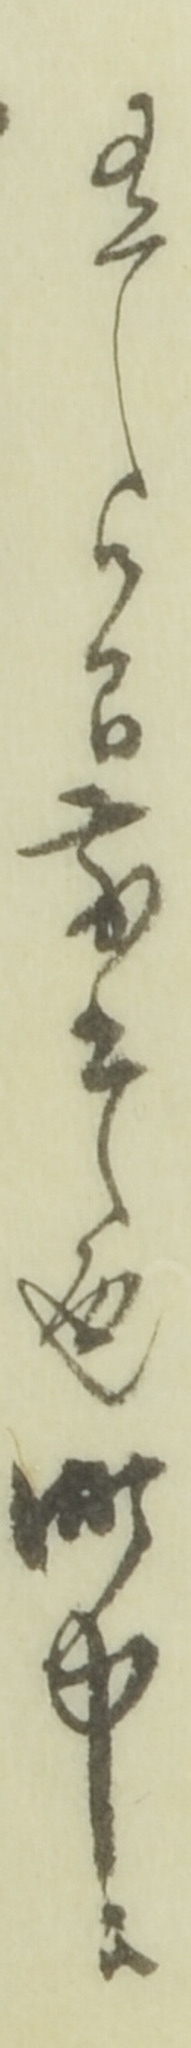有之候間前書之通町中江
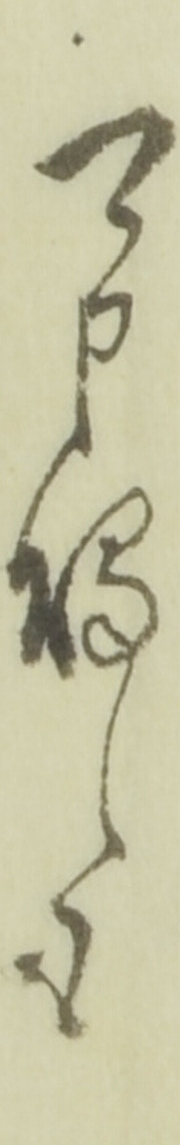可申触候以上
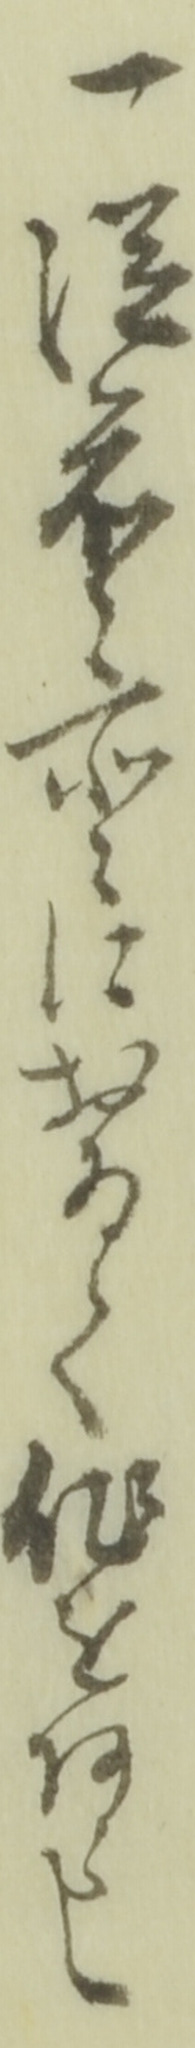一従前々所々におゐて作をあらし
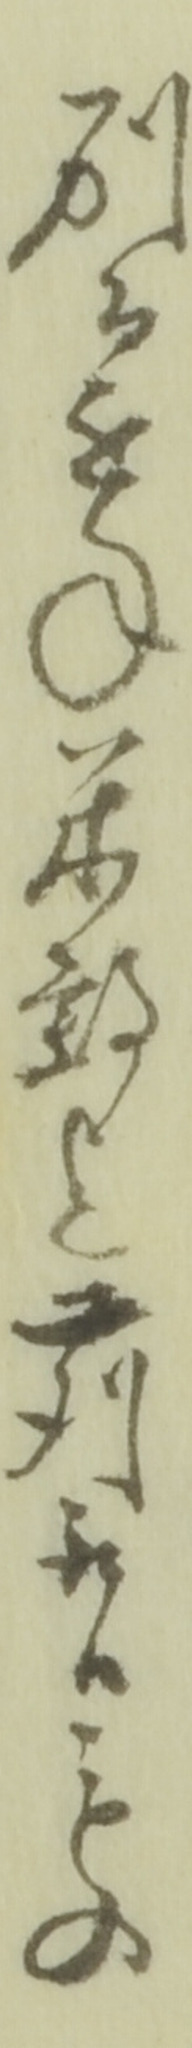別而近年米穀迄苅取候もの
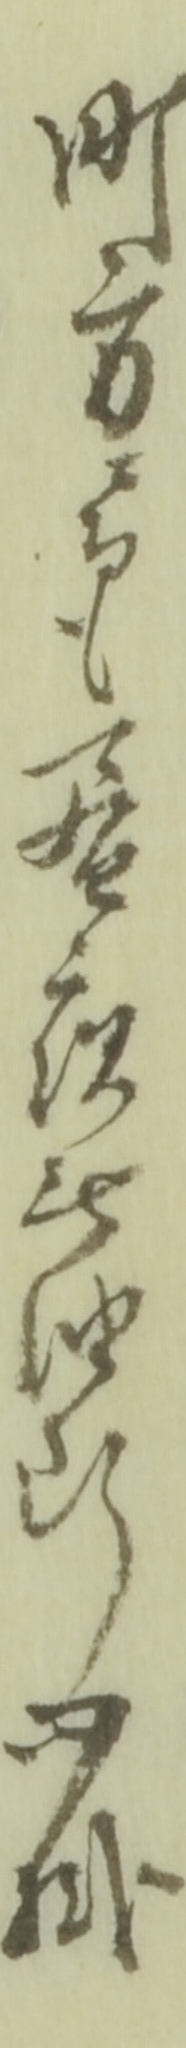町方ニ而も昼夜無油断心掛
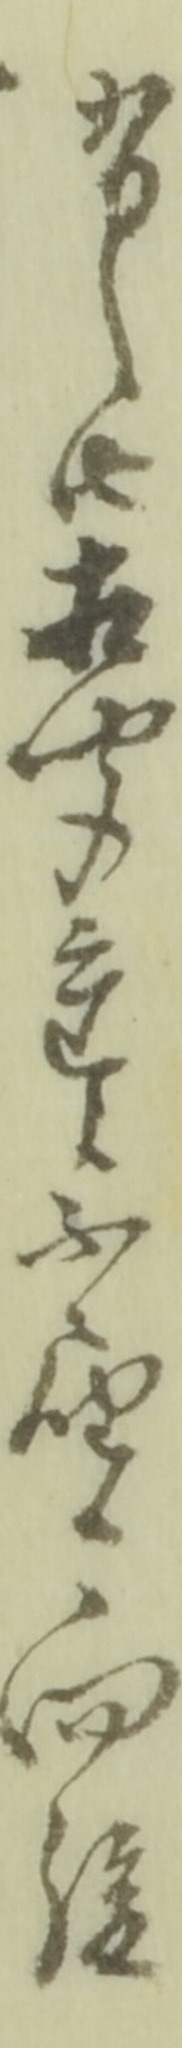有之由相聞置候不届候向後
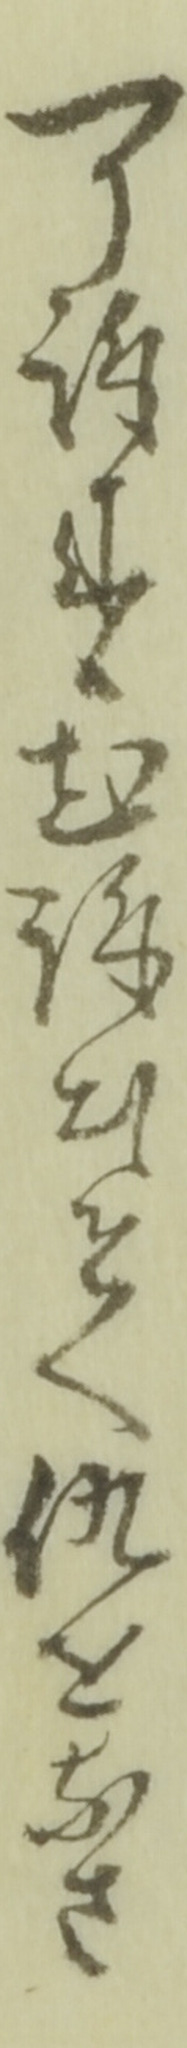可訴来候尤訴出候者へ仇をなさ
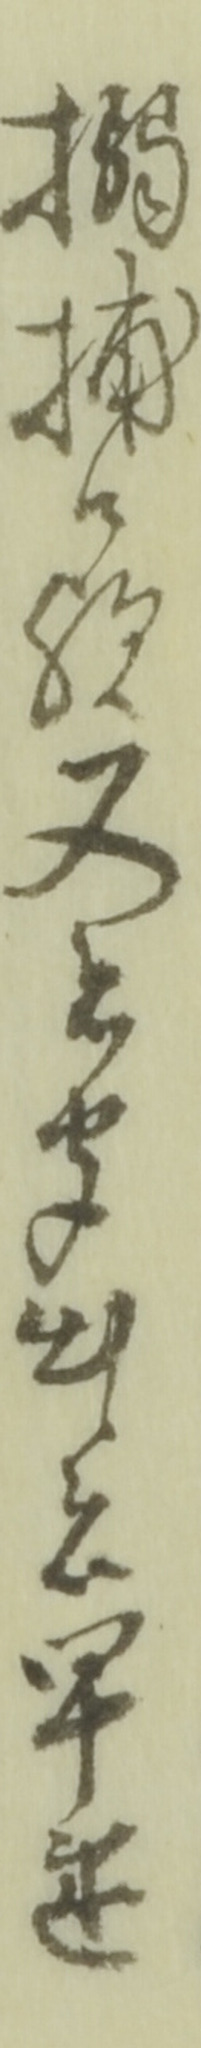搦捕候歟又者聞出候者早速
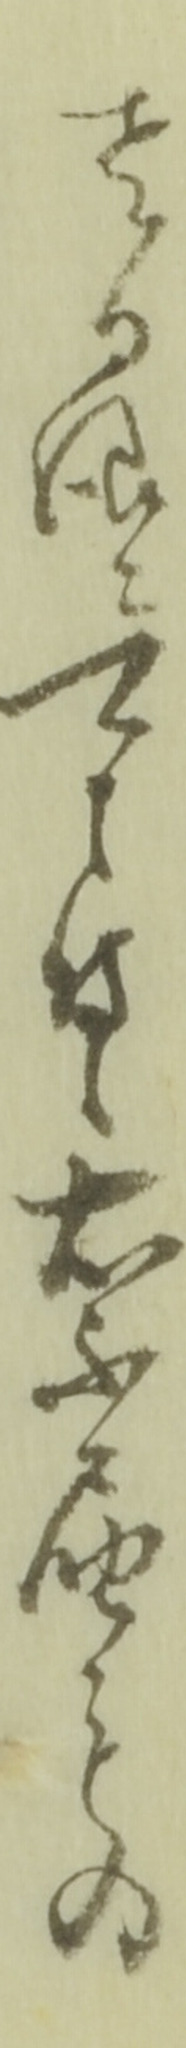さる様二可申付候右不届もの
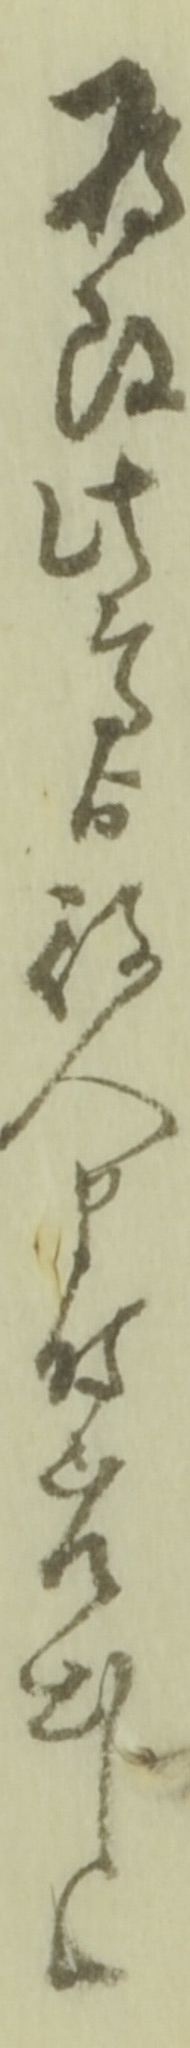為改此高ゟ役人申付差出し候
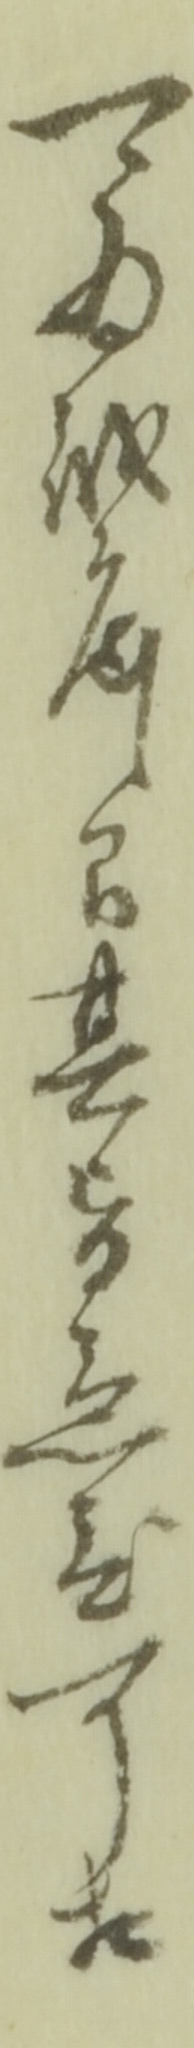可為越度候間其旨急度可相
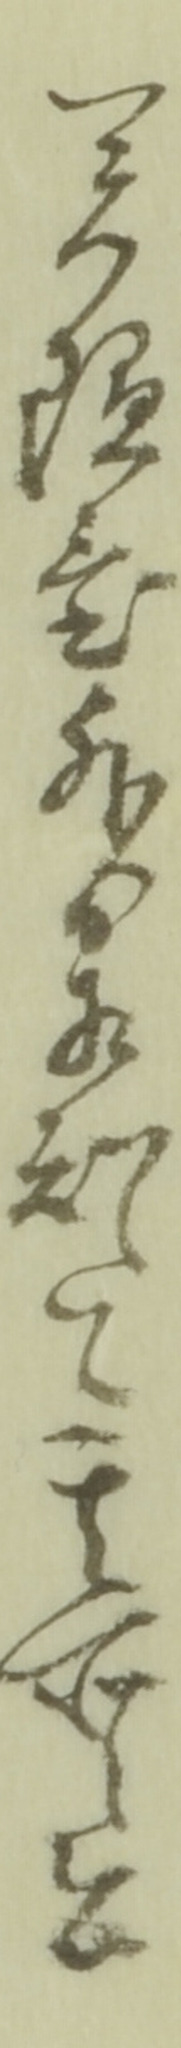若隠置外ゟ相知候ハヽ其所之者
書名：御公儀様御領主様御触書控
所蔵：伊那市立高遠町図書館・合同会社AMANE
